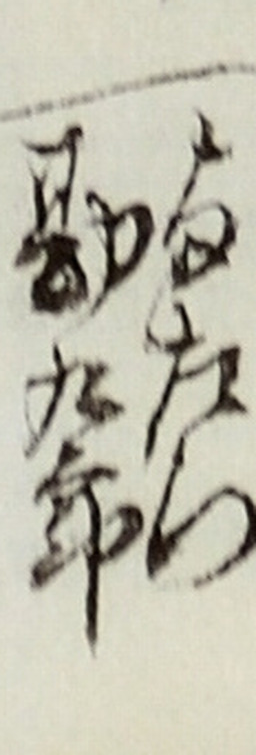勘九郎
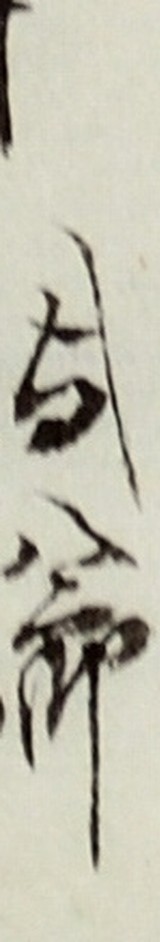与八郎
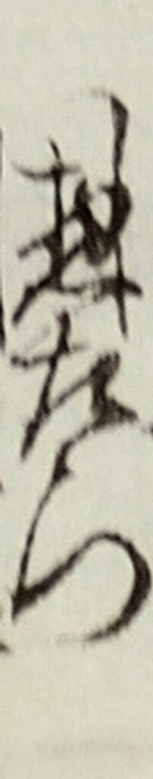惣左衛門
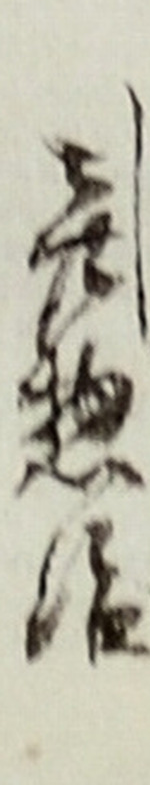喜惣治
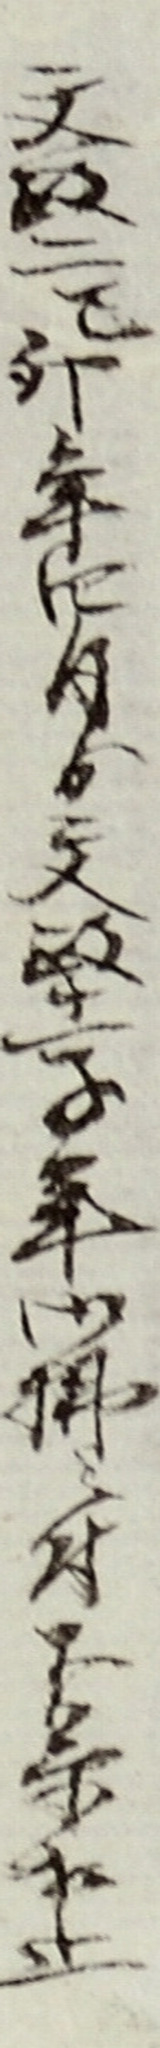文政二乙卯年四月ゟ文政十一子年御払ニ付下草相止
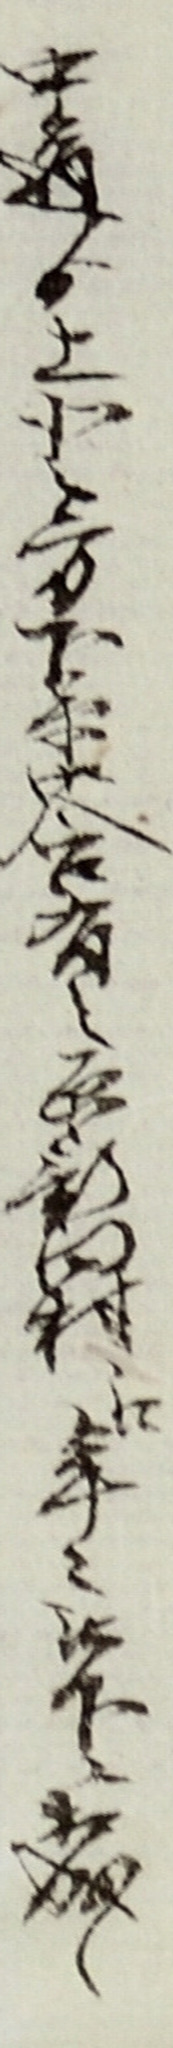中通ゟ上北之方下草御含有之原新田村え年々被下ニ相成候
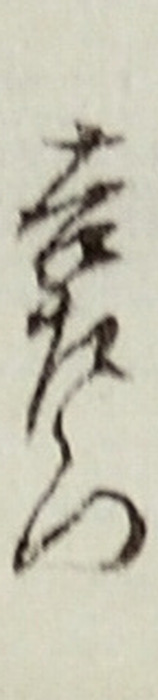吉左衛門
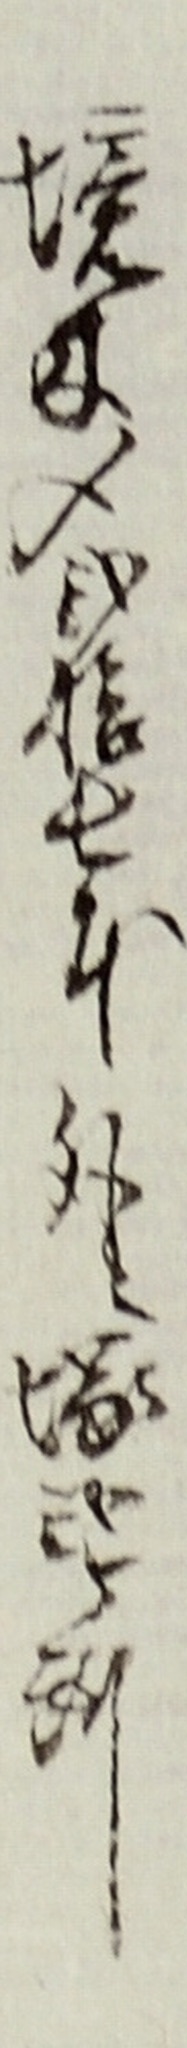境木〆弐拾七本外ニ塚弐ケ所
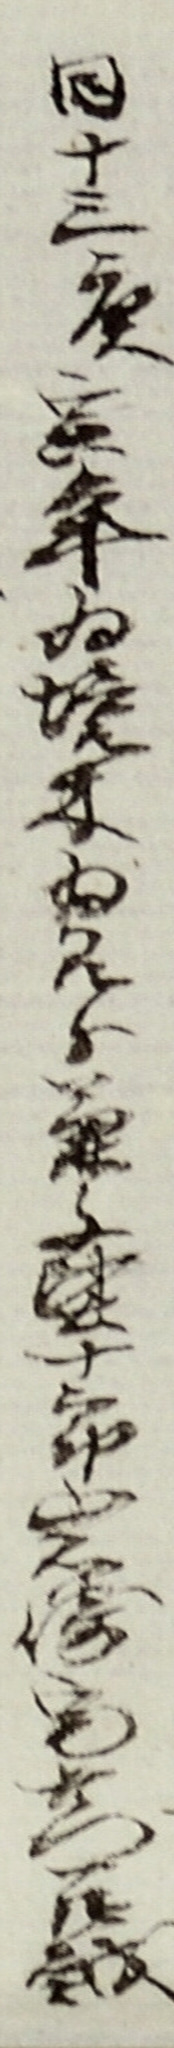同十三庚寅年為境木為見分兼子堅十郎岩崎宅右衛門罷越

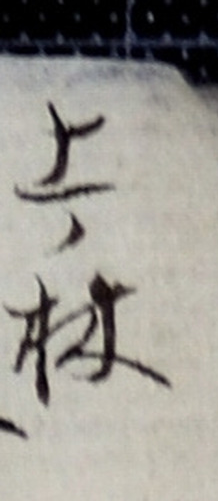上ノ林
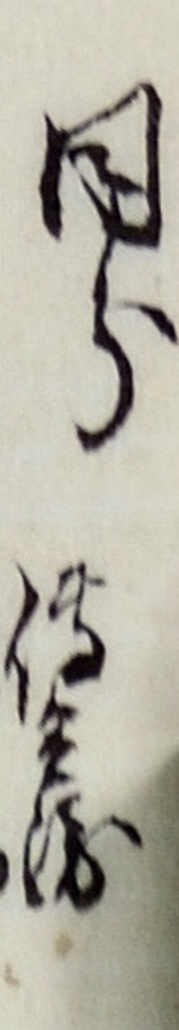同分伝兵衛
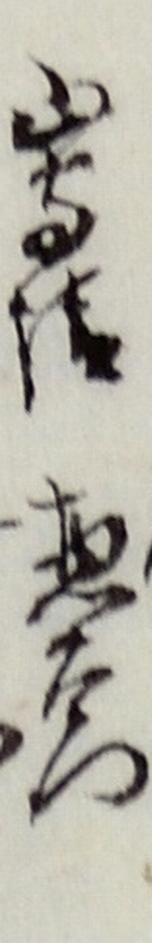山守請惣右衛門
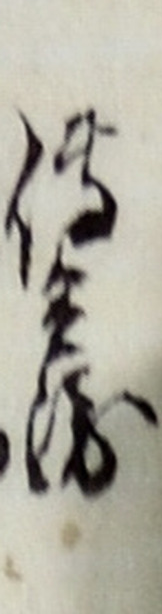宇兵衛
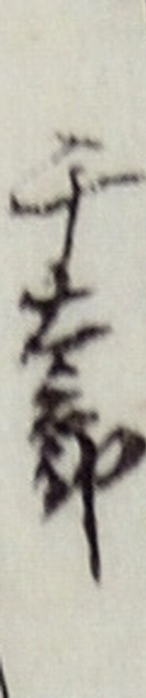千太郎
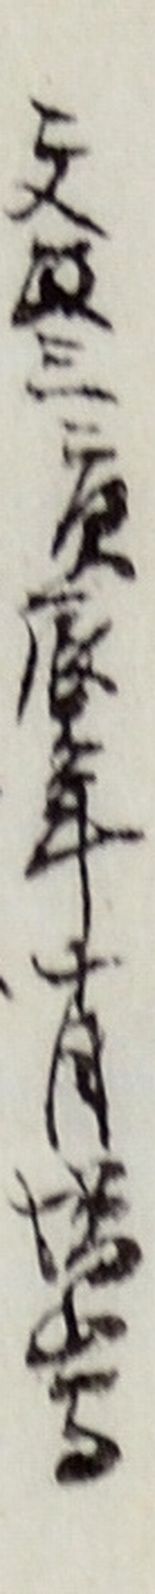文政三庚辰年十月増山守
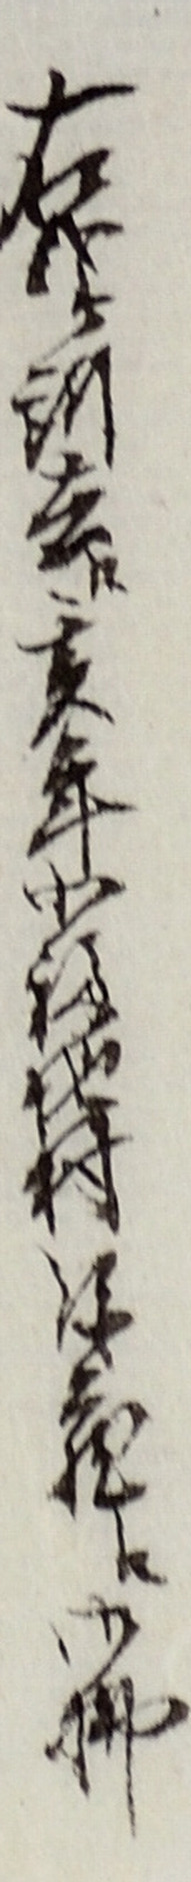右弐ケ所去ル亥年北福地村弥蔵え御払
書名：山林帳草稿
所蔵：伊那市立高遠町図書館・合同会社AMANE
